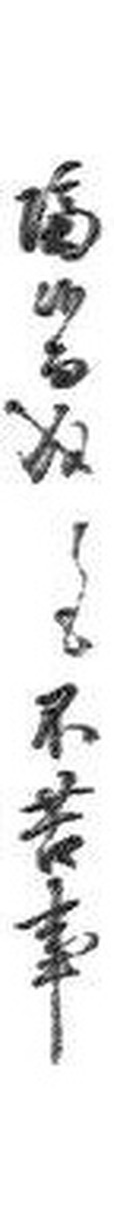隔候而成とも不苦事
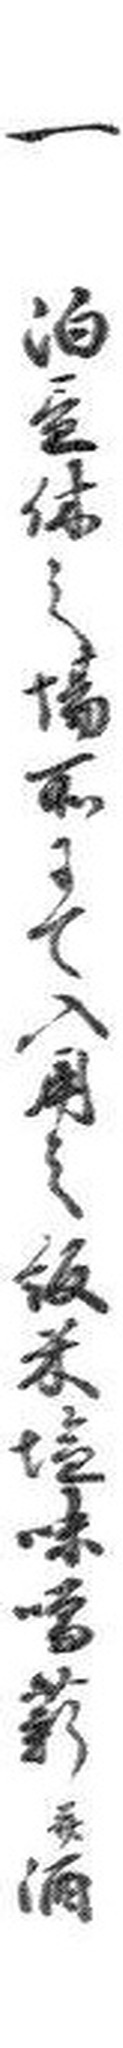一泊昼休之場所にて入用之飯米塩味噌薪并酒
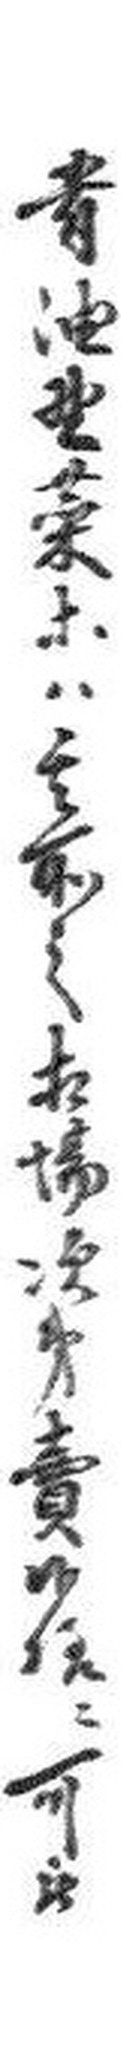肴油野菜等ハ其所之相場次第売候様ニ可被
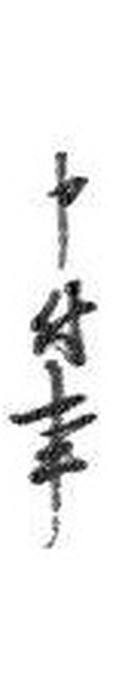申付事
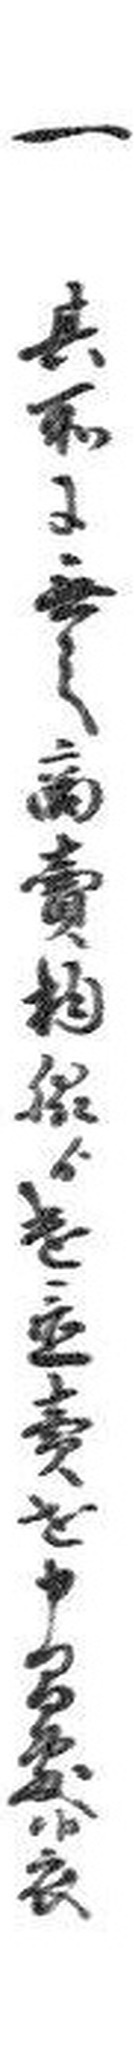一其所に無之商売物脇ゟ遣置売せ申間敷候衣
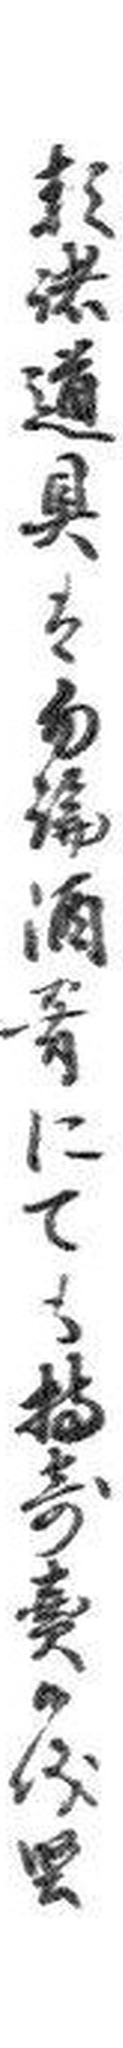類諸道具は勿論肴にても持寄売候儀堅
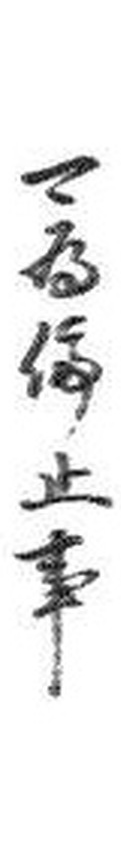可為停止事
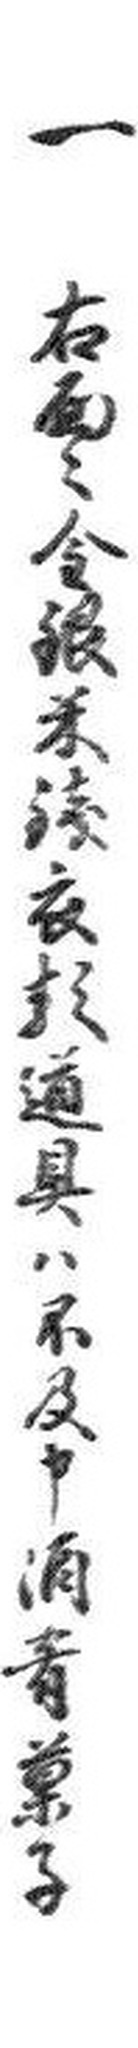一右面々金銀米銭衣類道具ハ不及申酒肴菓子
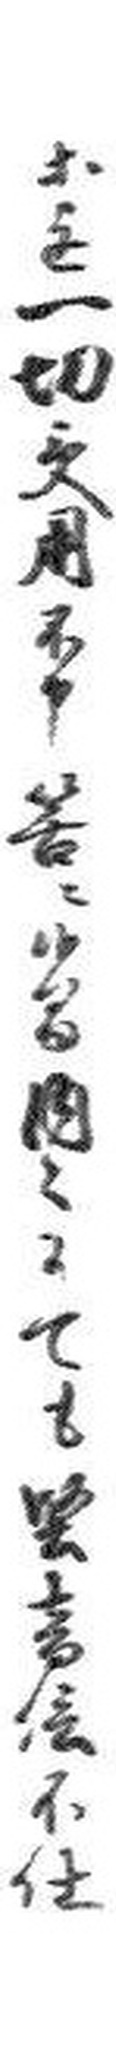等迄一切受用不申筈ニ候間内々にても堅音信不仕

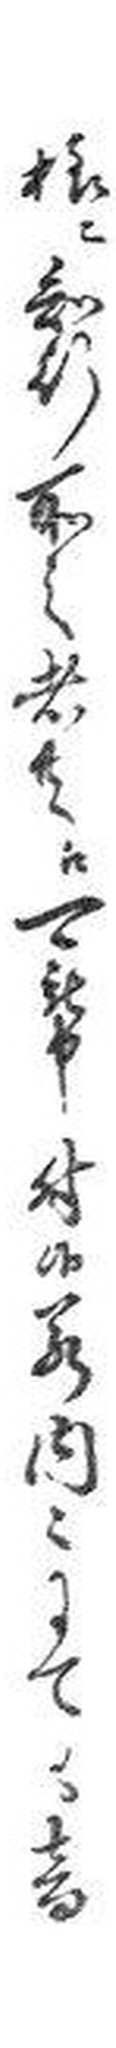様知行所之者共江可被申付候若内々にても音
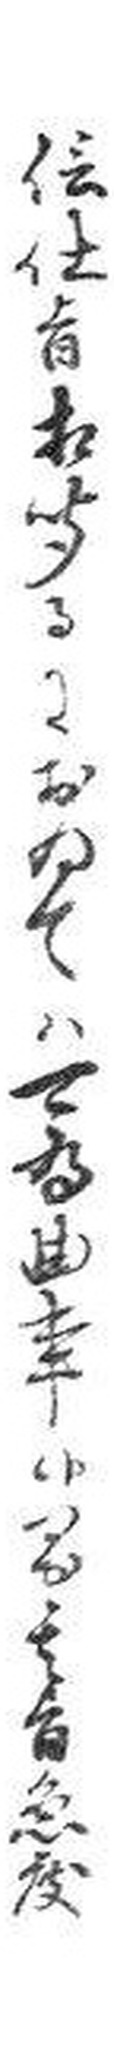信仕旨相聞るにおゐてハ可為曲事候間其旨急度
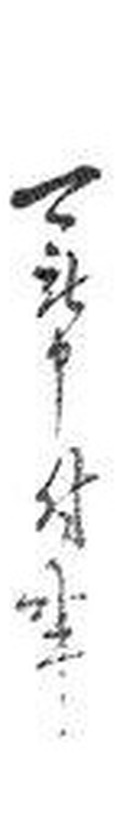可被申付事
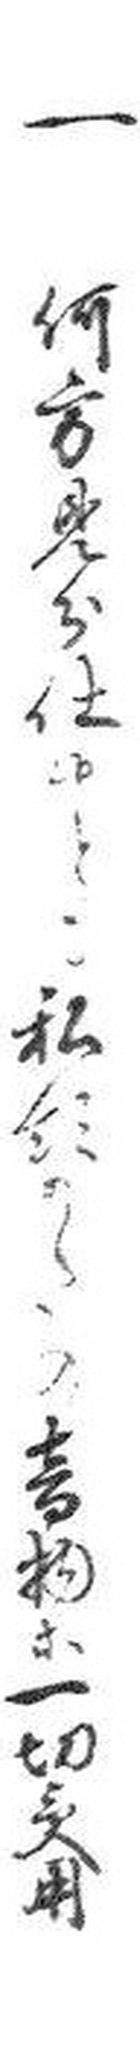一何方見分仕候とも私領かたの音物等一切受用
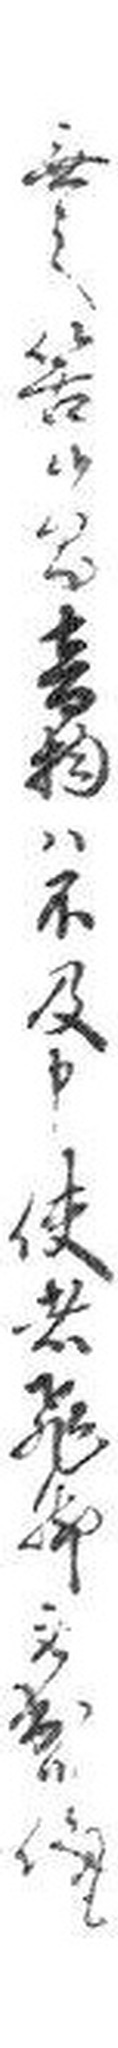無之筈候則音物ハ不及申使者飛脚被出候儀も
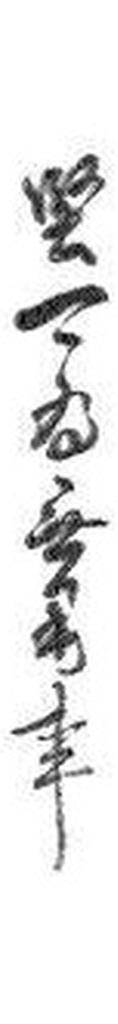堅可為無用事
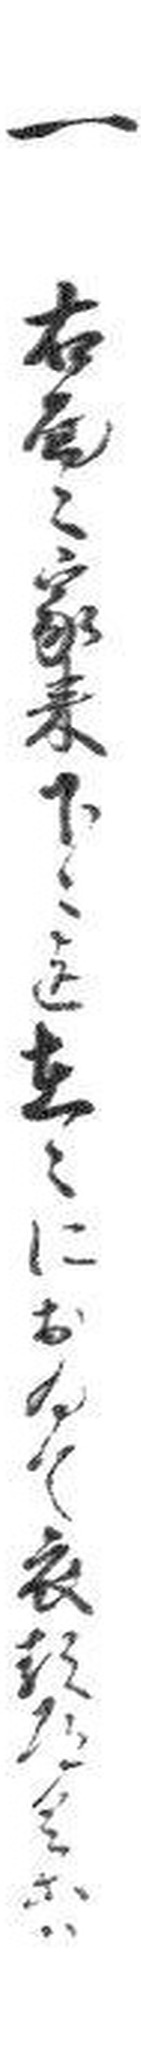一右面々家来下々迄在々におゐて衣類道具等ハ
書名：家譜 二十九 吉邦公 従正徳二年到正徳三年
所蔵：福井県文書館 Fukui Prefectural Archives
